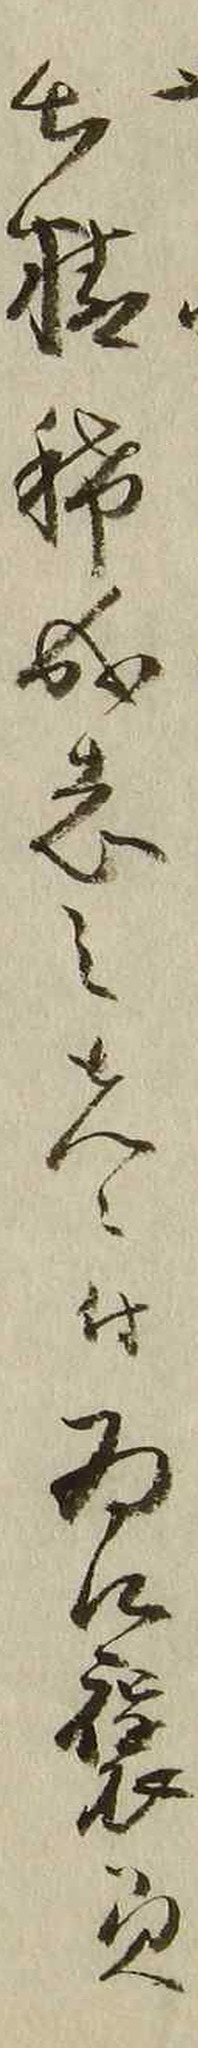出精稀成志之者ニ付為御褒美
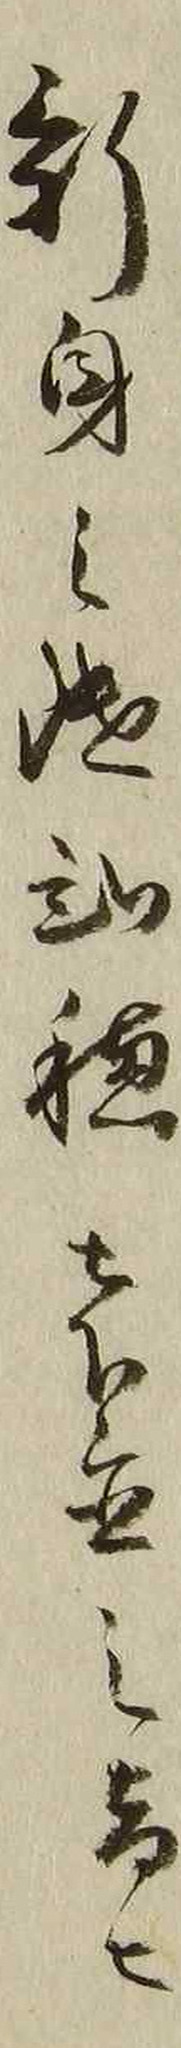新身之鑓弐穂被下置之旨被
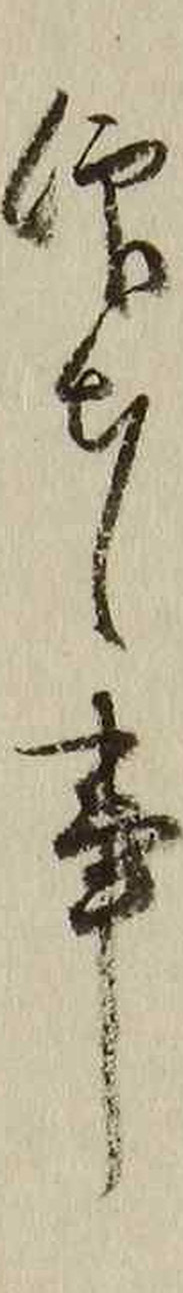仰出候事
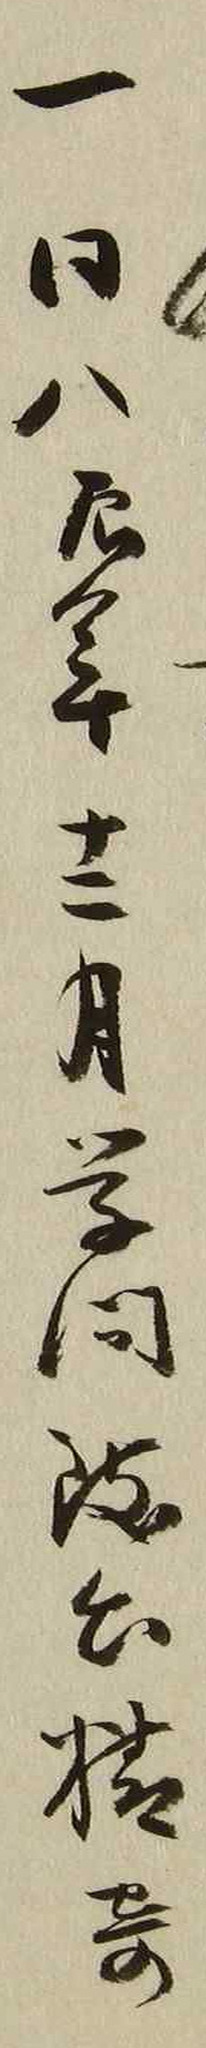一同八辰年十二月学問致出精奇
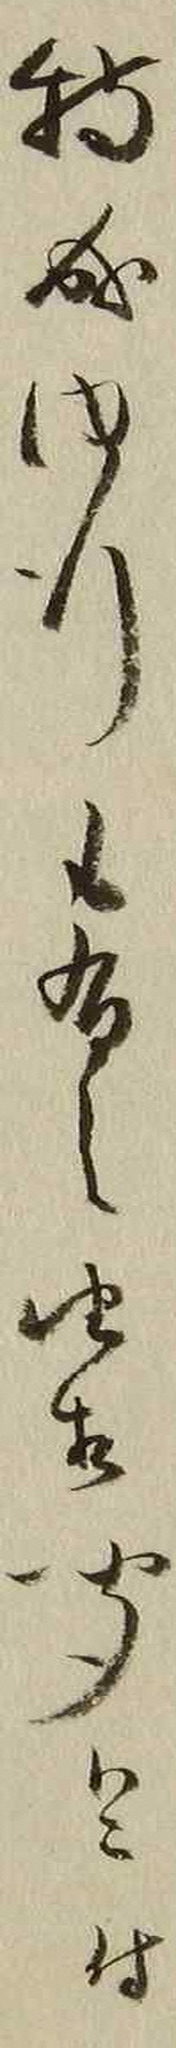特成内行も有之由相聞候ニ付
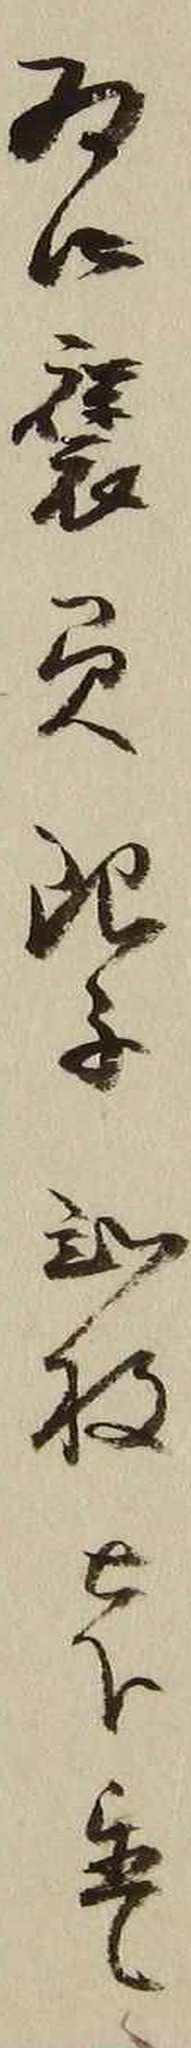為御褒美銀子弐枚被下置候
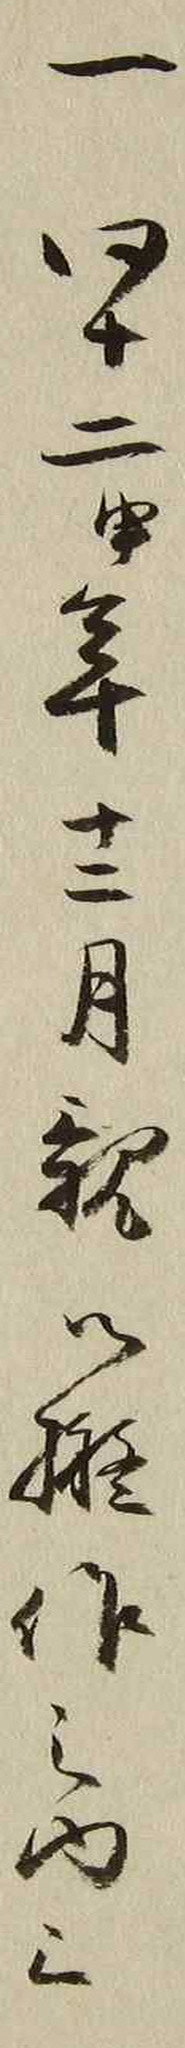一同十二申年十二月親御擬作之内三
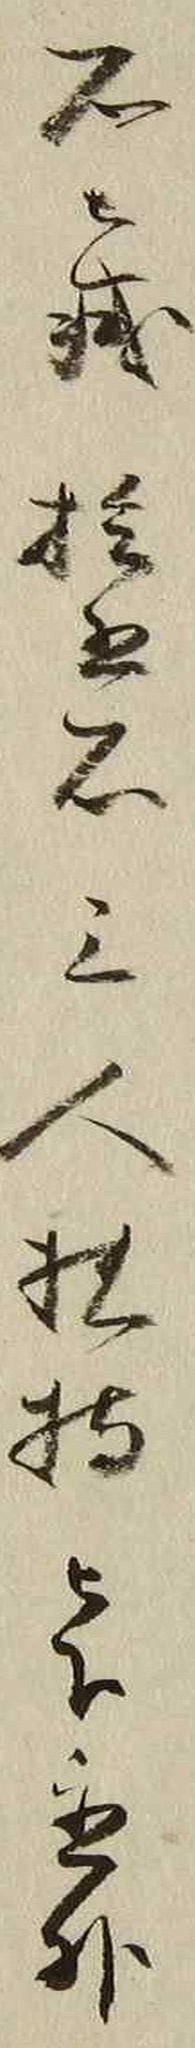石被減拾五石三人扶持被下置外
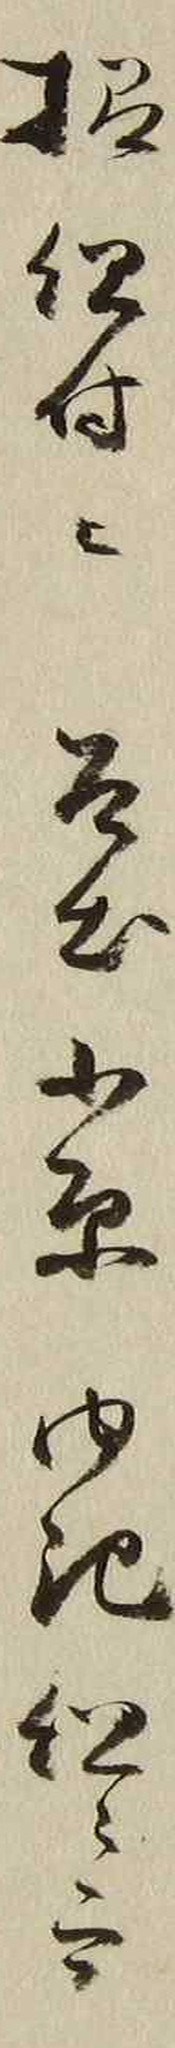様組付被召出小原内記組ニ而
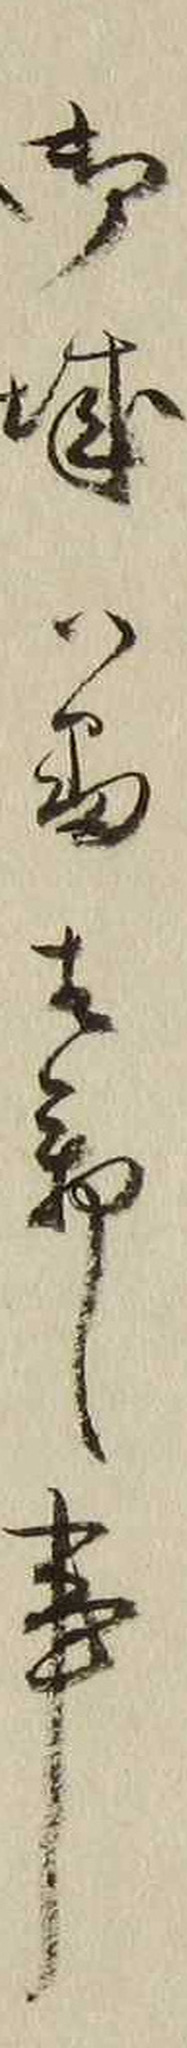御城御番相勤候事
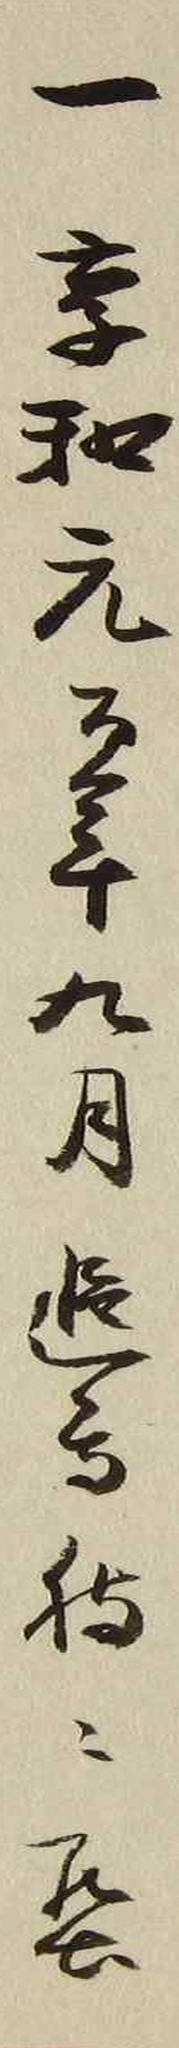一享和元酉年九月追鳥狩ニ罷出
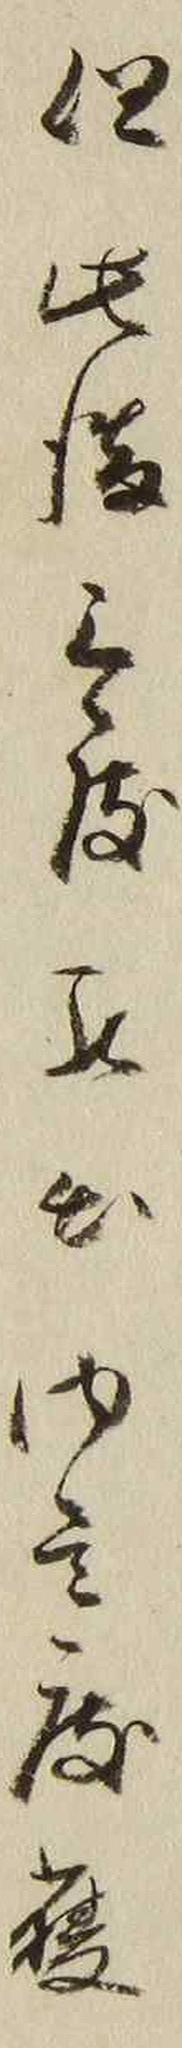但此後三度罷出内壱度獲
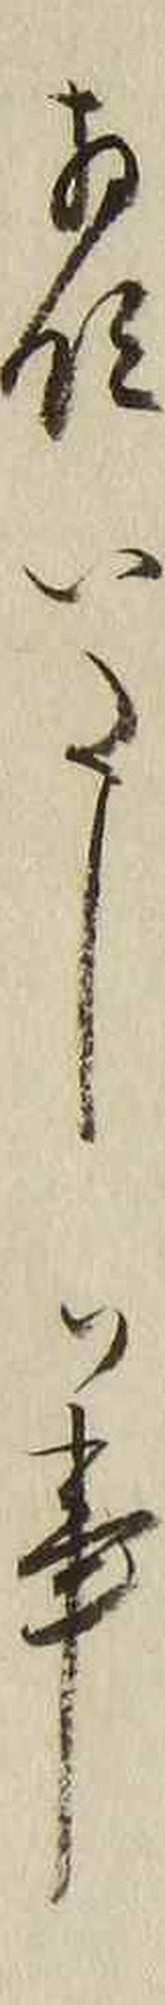拝領いたし候事
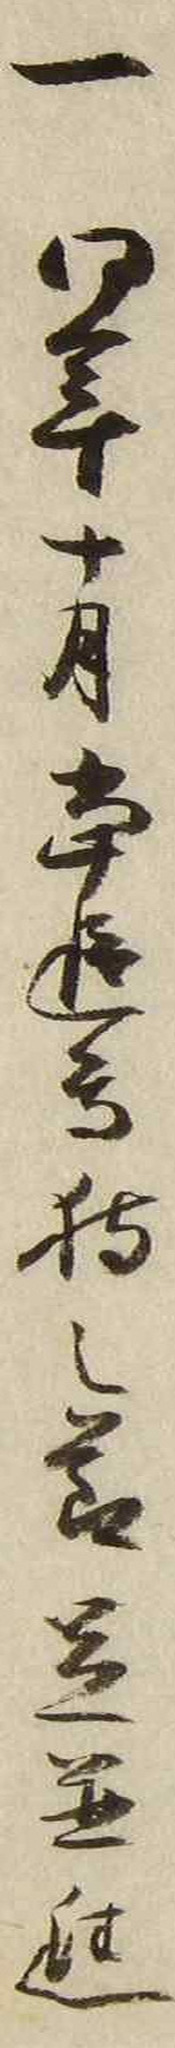一同年十月当追鳥狩之節足並進

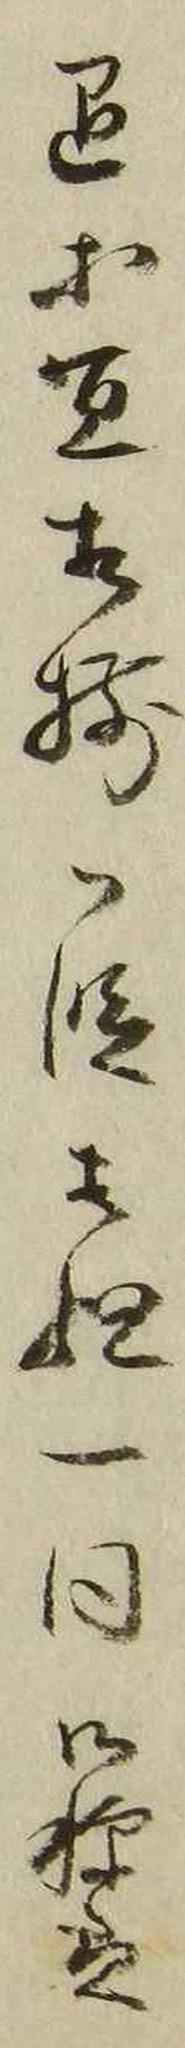退等宜相揃候段相組一同御称美
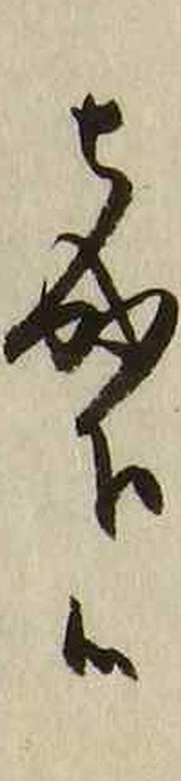被成下候
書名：諸士系譜　巻之288　さ之部20
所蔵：会津若松市立会津図書館
